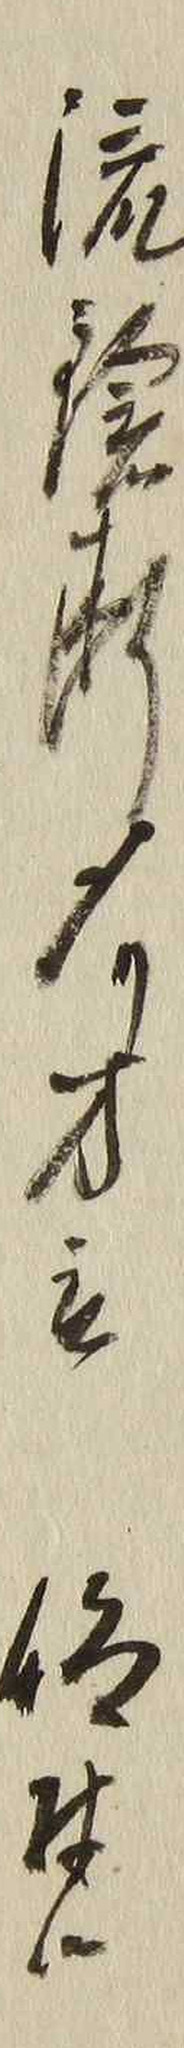流鎗術〆り方被仰付候
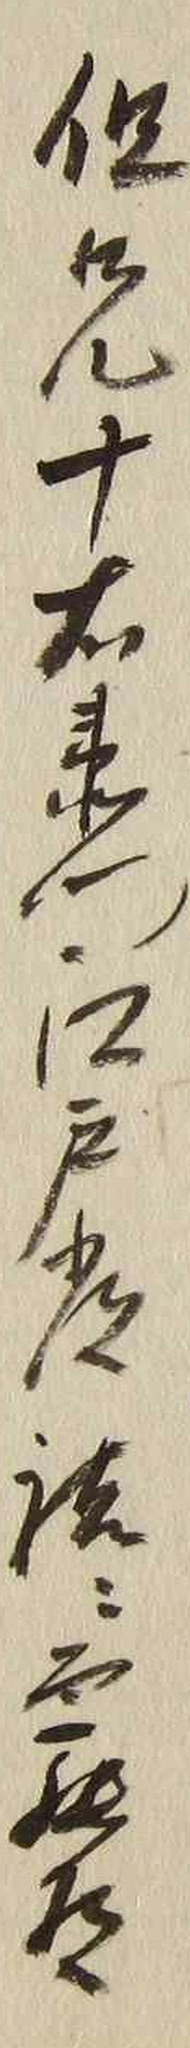但兄十右衛門江戸常詰ニ而罷有
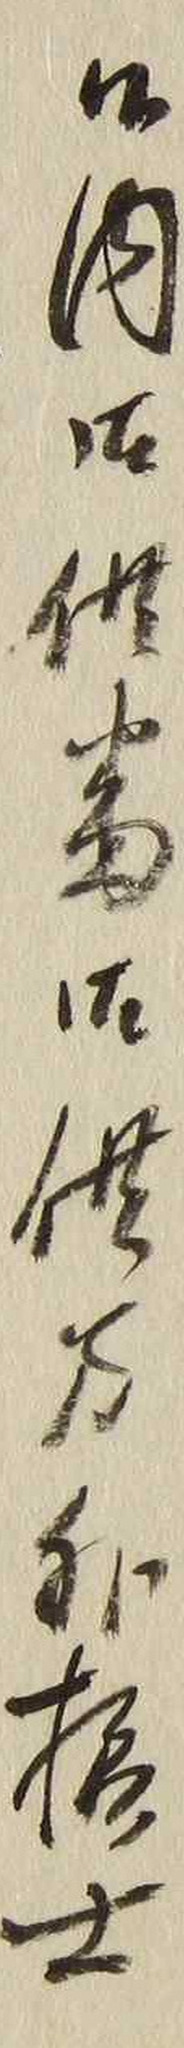候内御供番御供方外様士
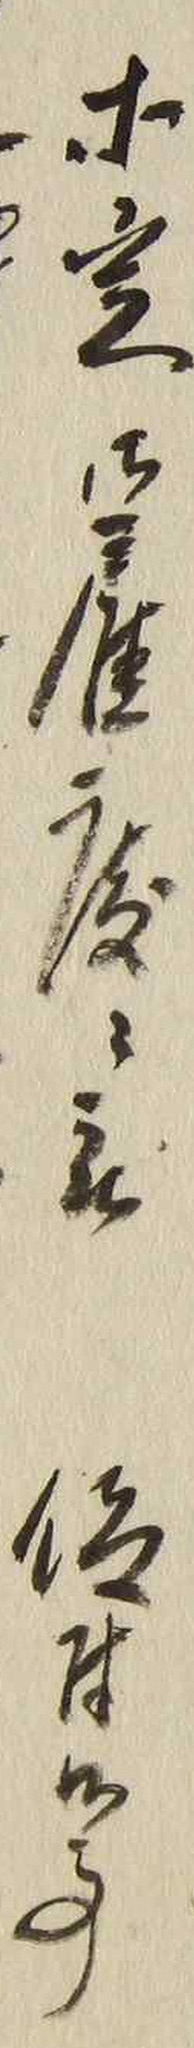等定御雇度々被仰付候事
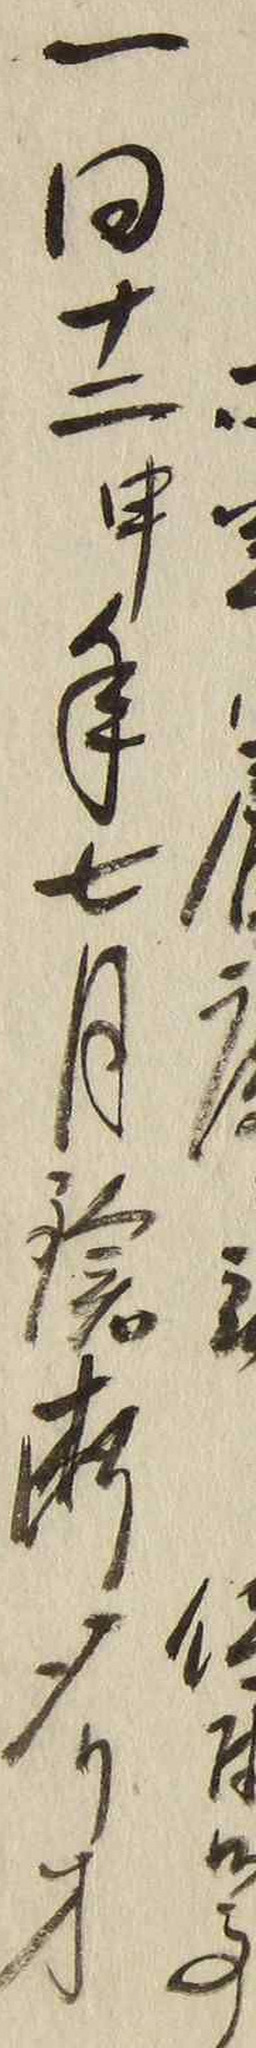一同十二申年七月鎗術〆り方

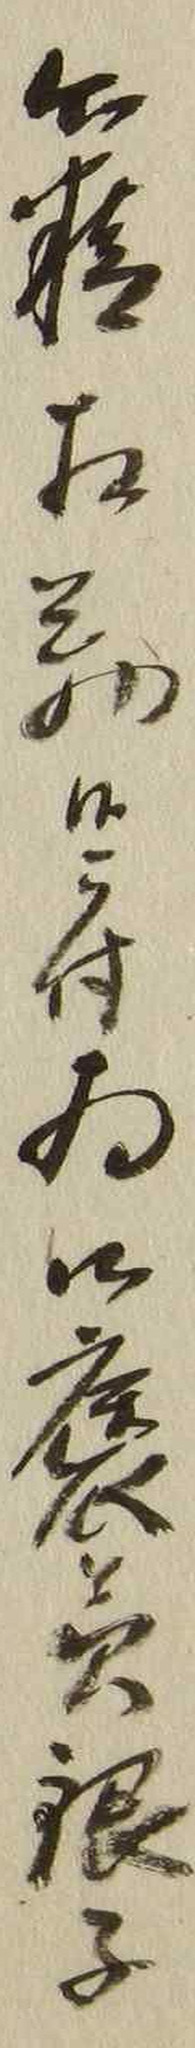出精相勤候ニ付為御褒美銀子
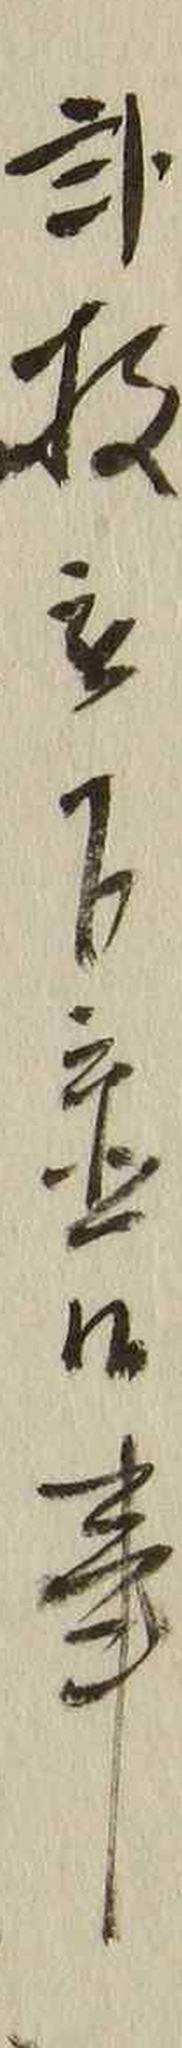弐枚被下置候事
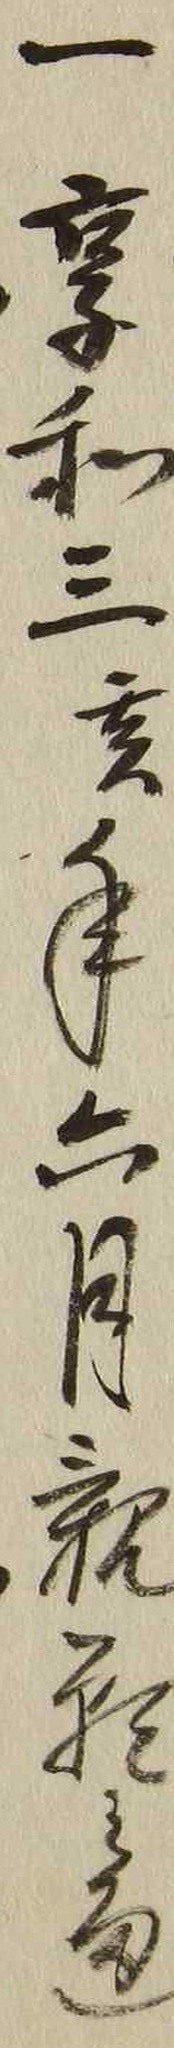一享和三亥年六月親願之通
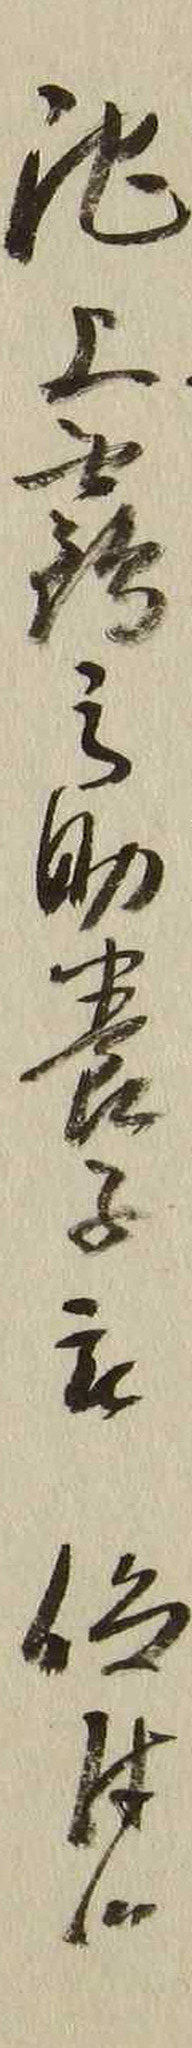池上鶴之助養子被仰付候
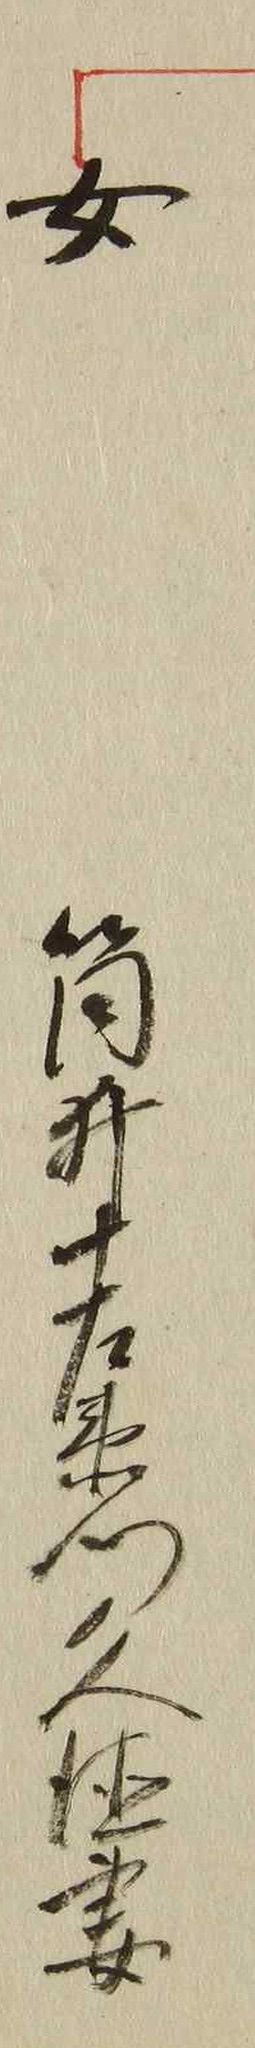女筒井十左衛門久徳妻
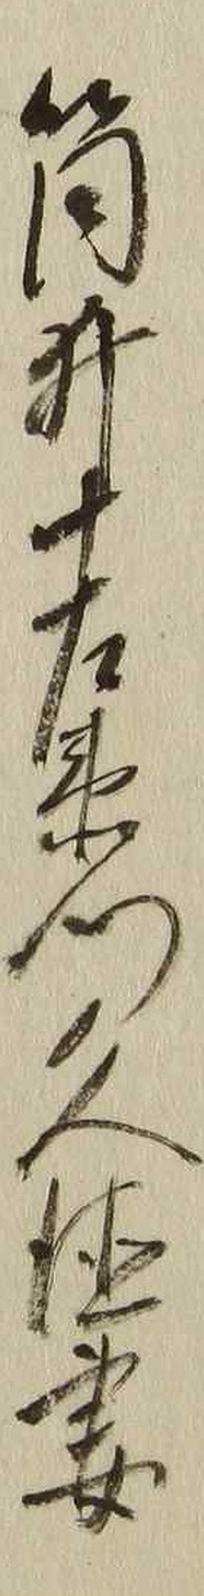女筒井十左衛門久徳妻
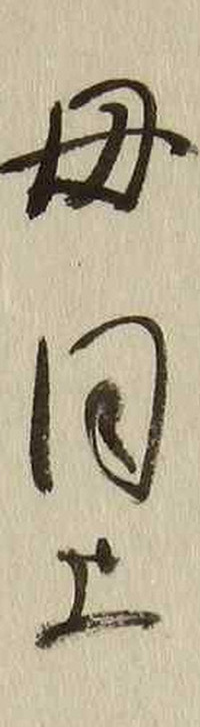母同上
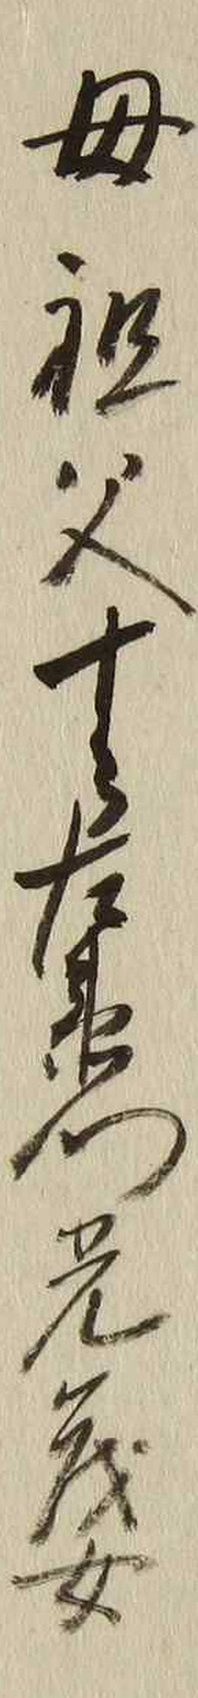母祖父十郎左衛門光茂女
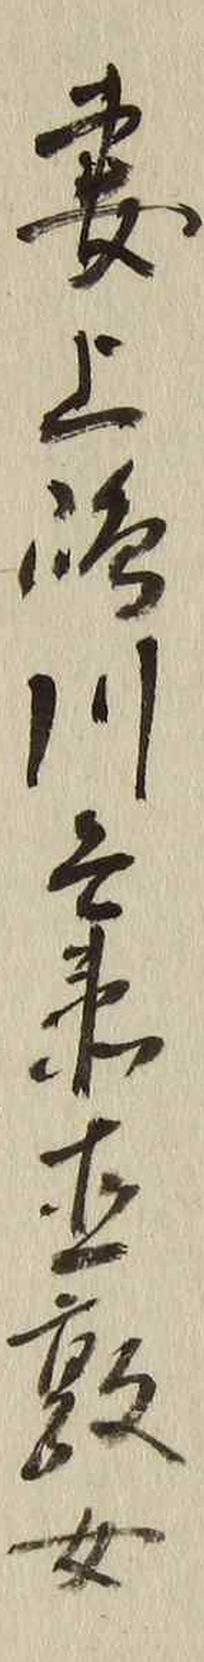妻上島川兵衛直敦女
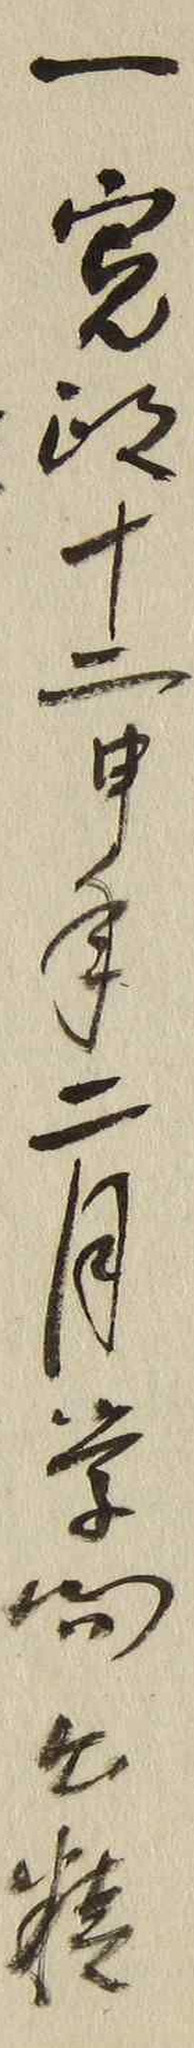一寛政十二申年二月学問出精
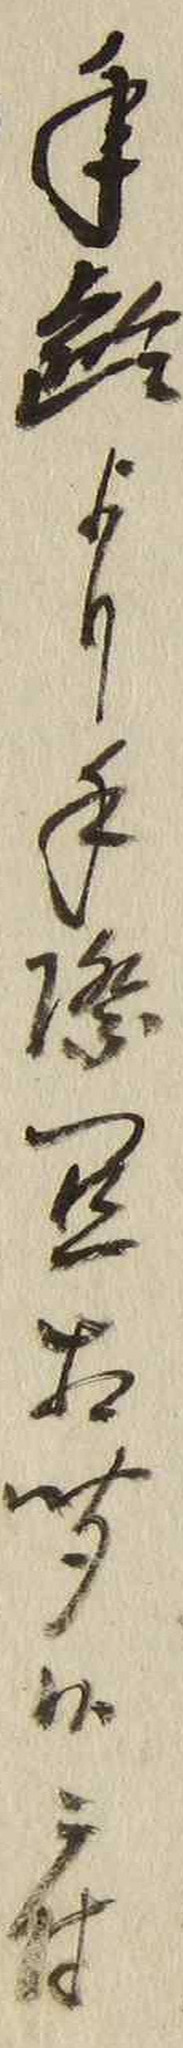年齢より手際宜相聞候ニ付
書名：諸士系譜　巻之359　す之部9
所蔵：会津若松市立会津図書館
